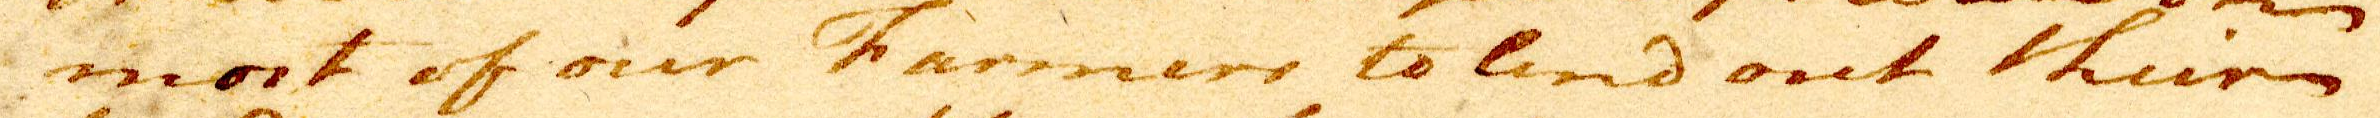most of our Farmers to conduct their
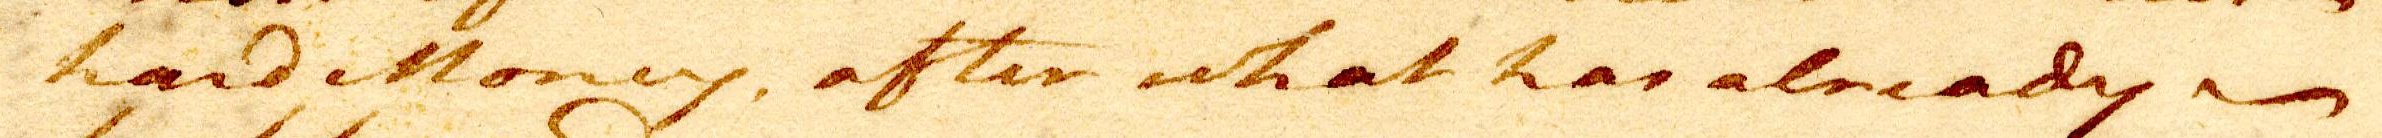hard Money, after what has already
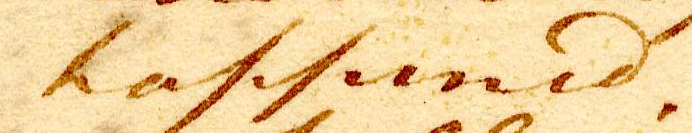happened
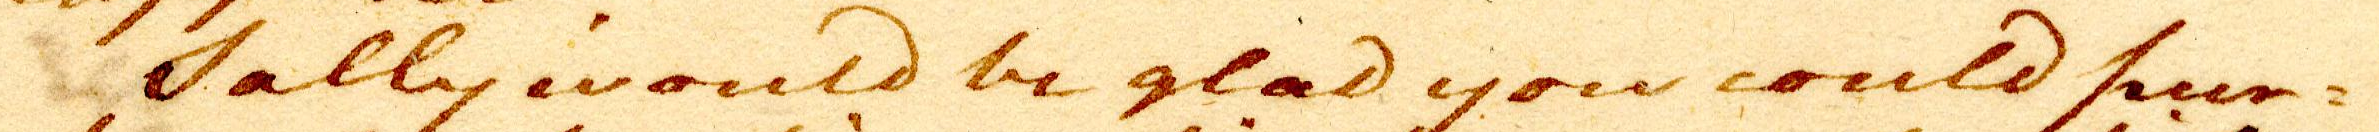Sally would be glad you could pur-
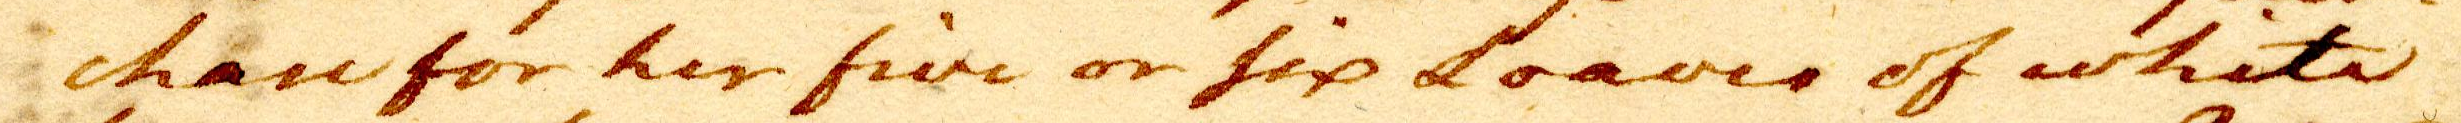-chase for her five or six Loaves of white
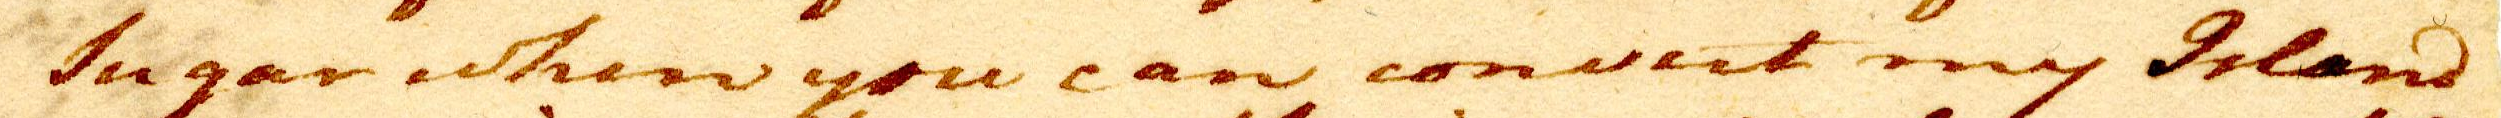sugar when you can convert my Island
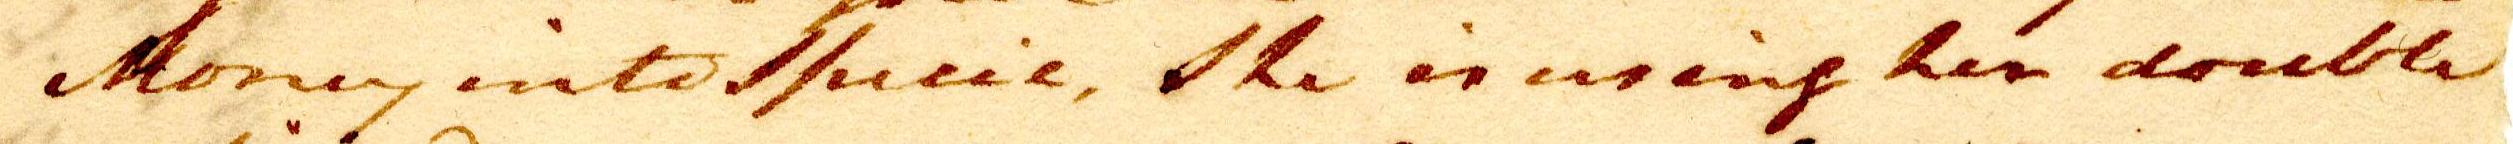Money into Specie, She is using her double
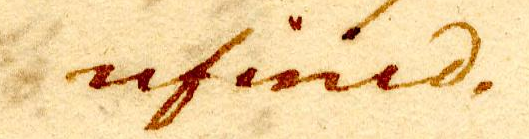refined
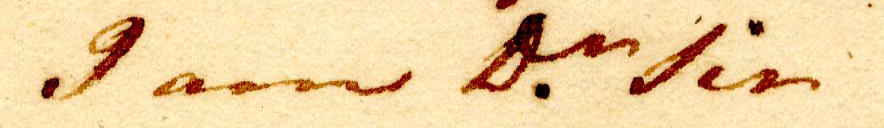I am D^r Sir
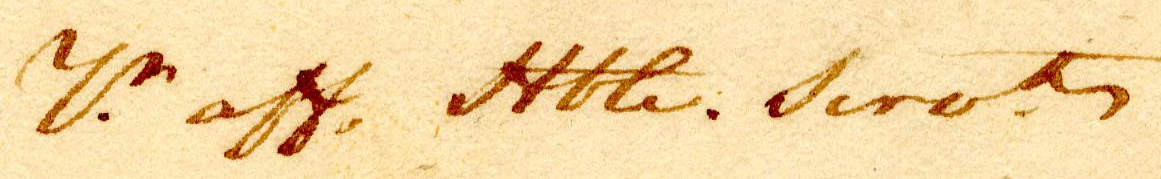Y^r. aff. Hble. Serv^t
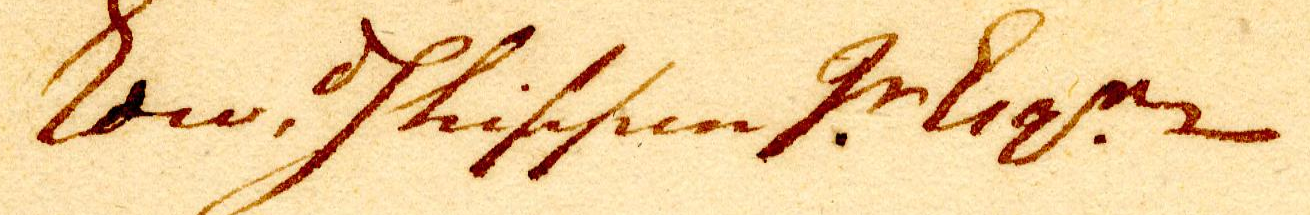Edw^d: Shippen J^r. Esq^r.
